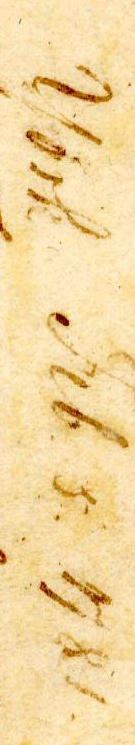York Feb. 5. 1781
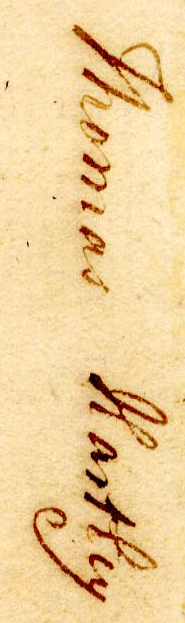Thomas Hartley
